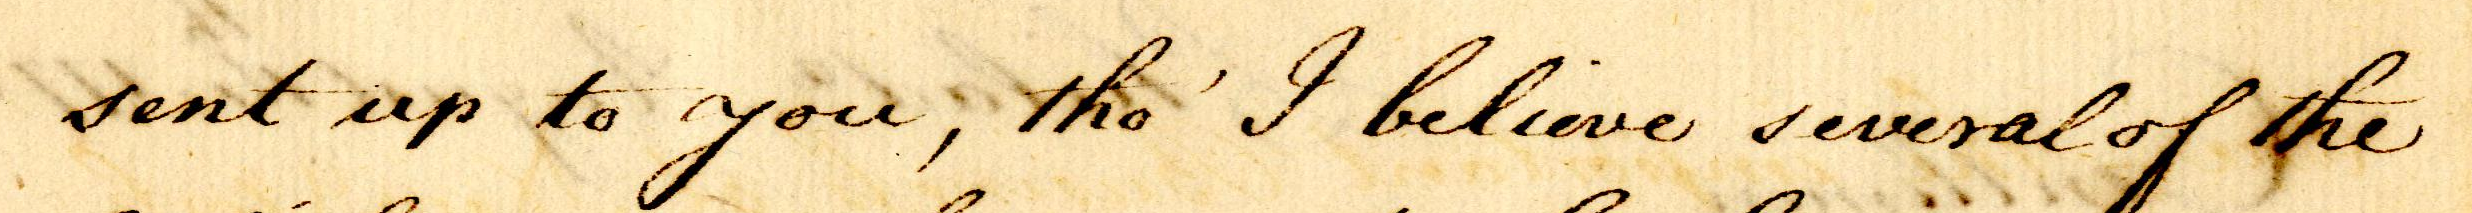sent up to you, tho' I believe several of the
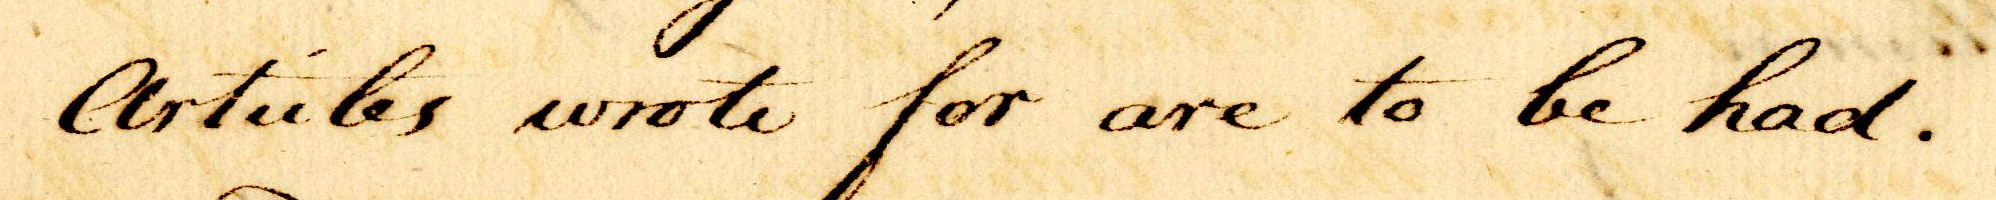Articles wrote for are to be had.
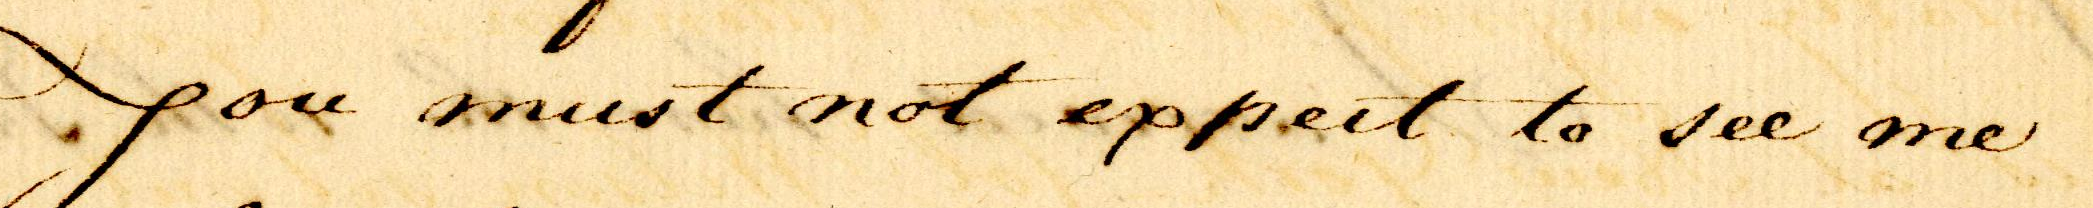You must not expect to see me
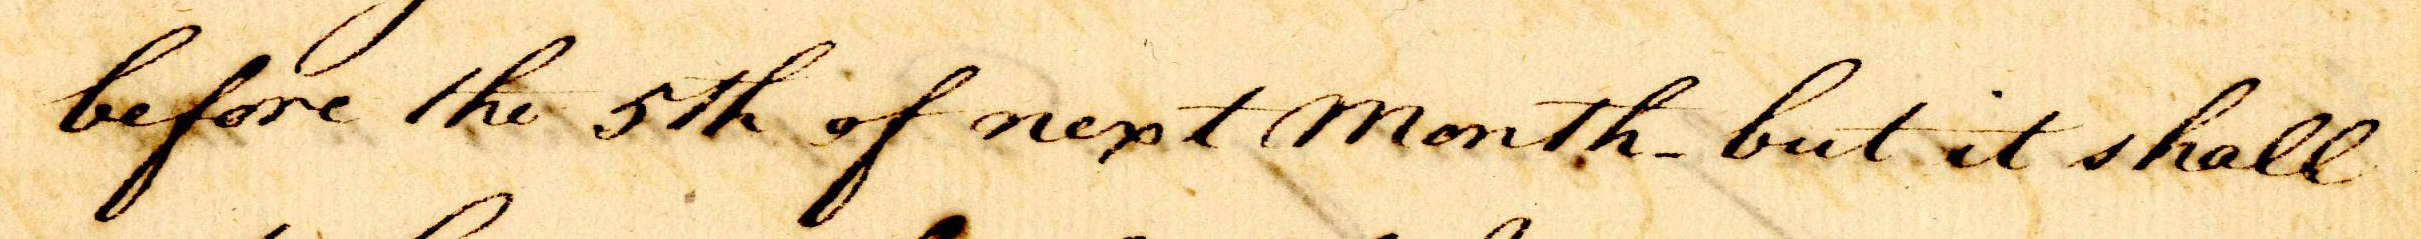before the 5th of next Month, but it shall
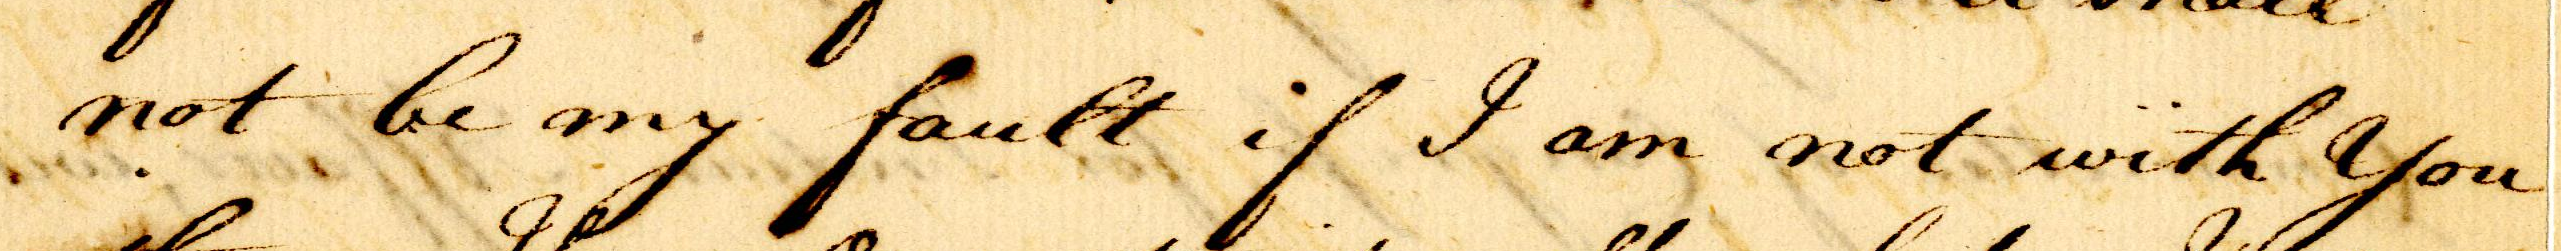not be my fault if I am not with You
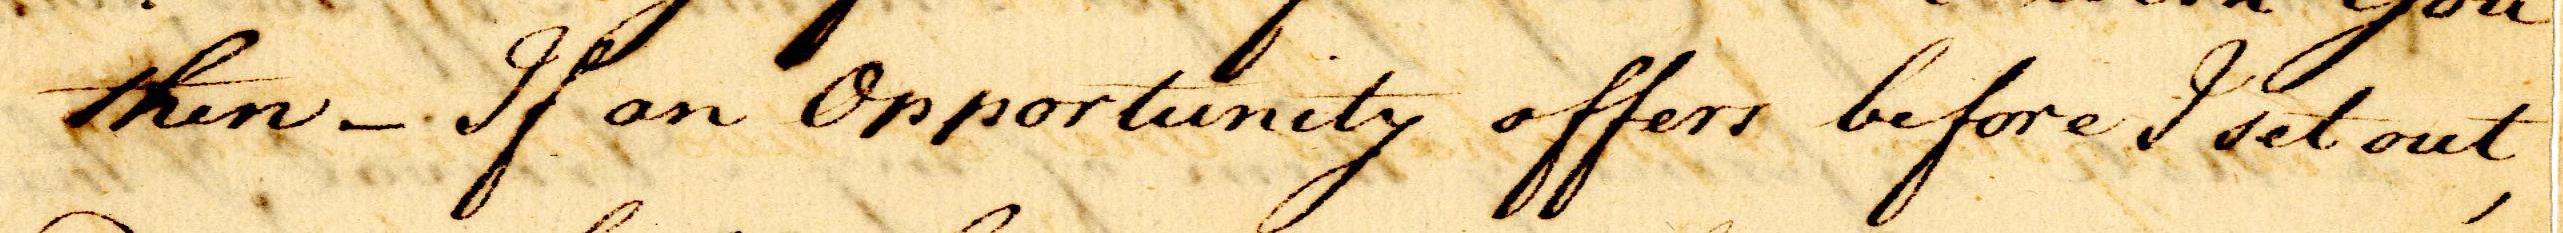then- If an Opportunity offers before I set out,
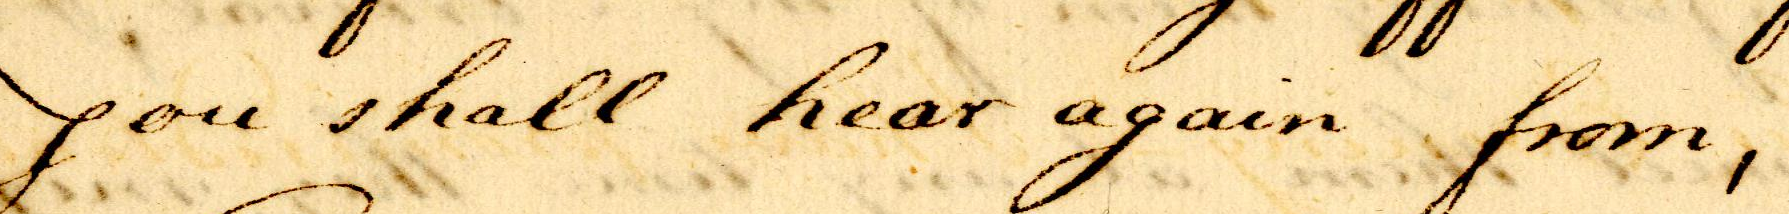you shall hear again from,
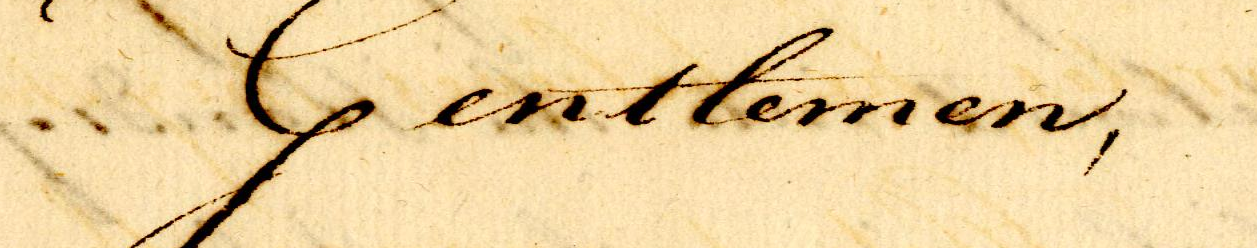Gentlemen,
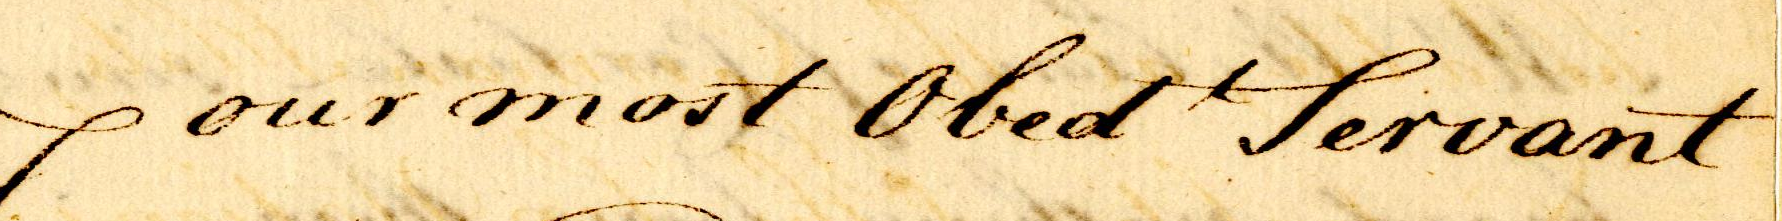Your most Obed^t Servant
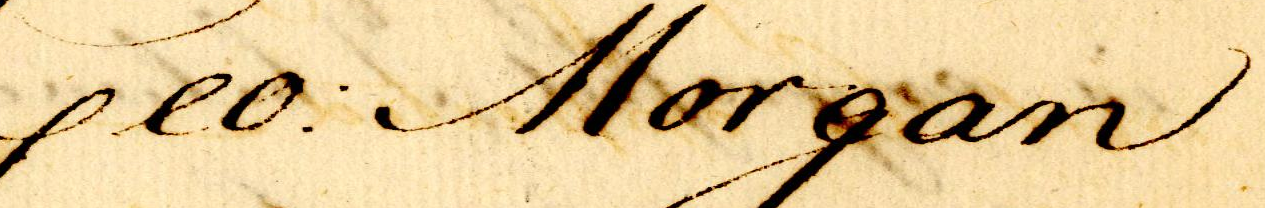Geo: Morgan
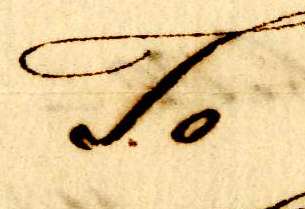To
